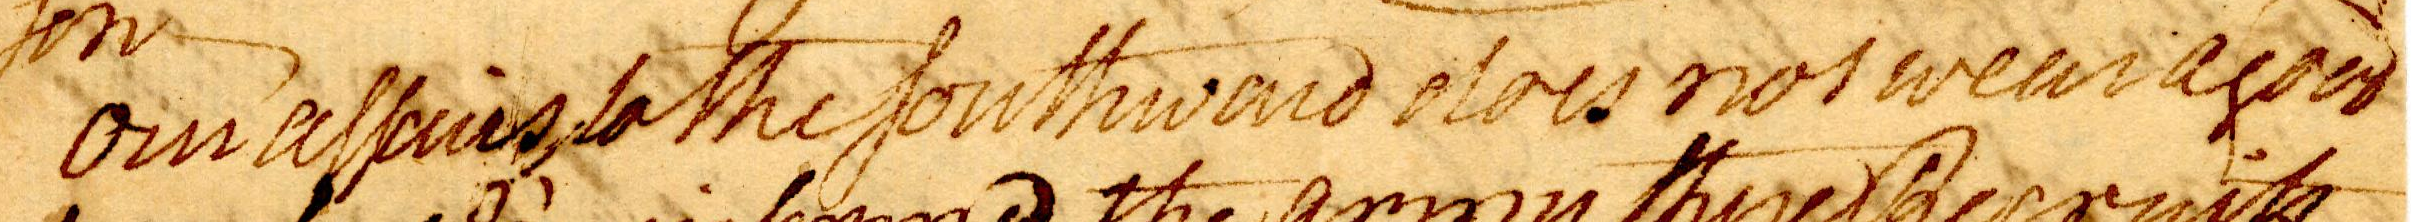Our affairs to the southwend does not wear a good
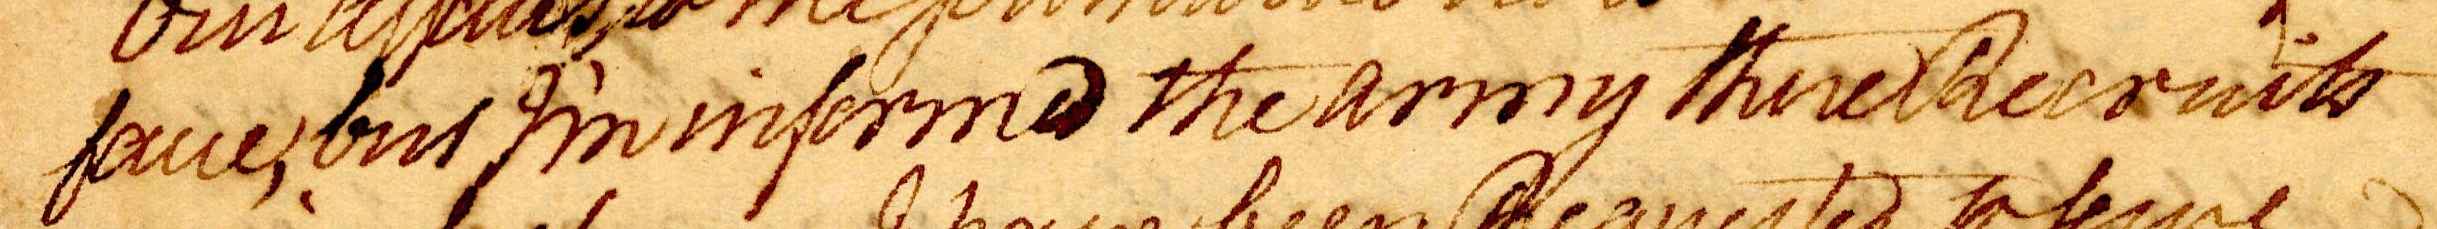face, but I'm informed the army there Recruits
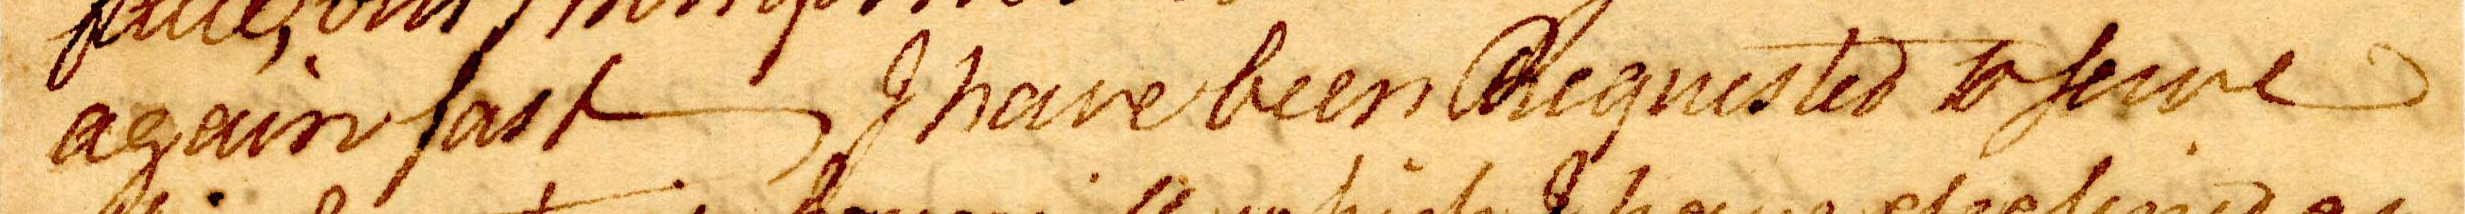again fast. I have been Requested to serve
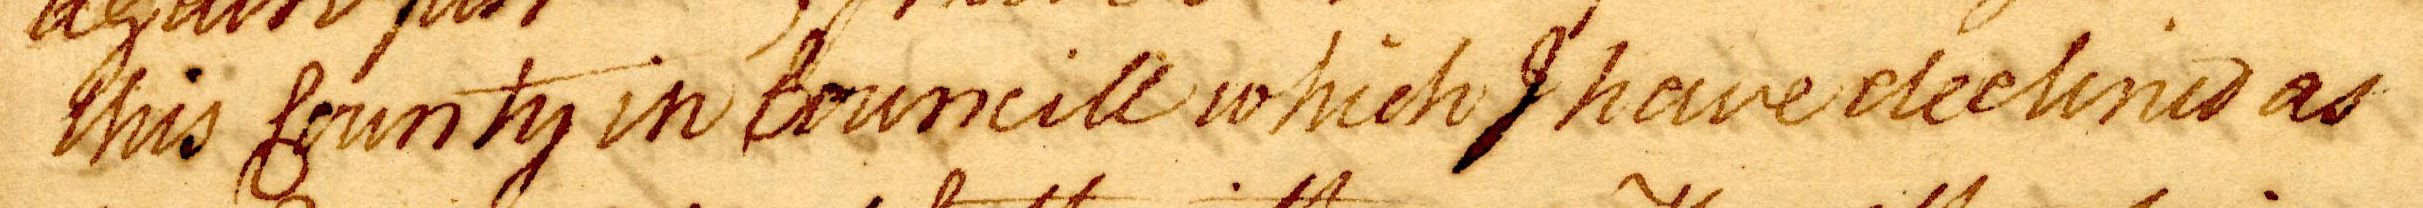this County in Councill which I have declined as
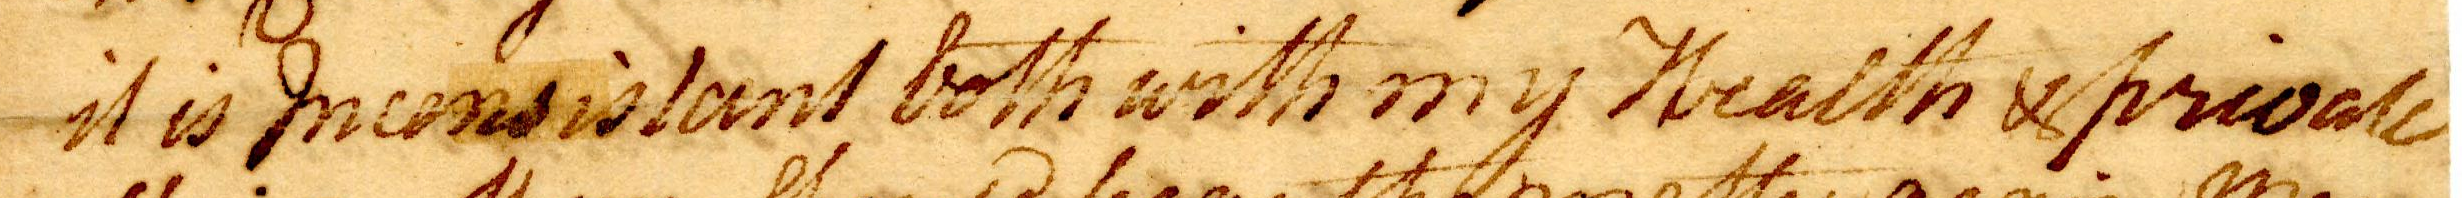it is Inconsistant both with my Health & private
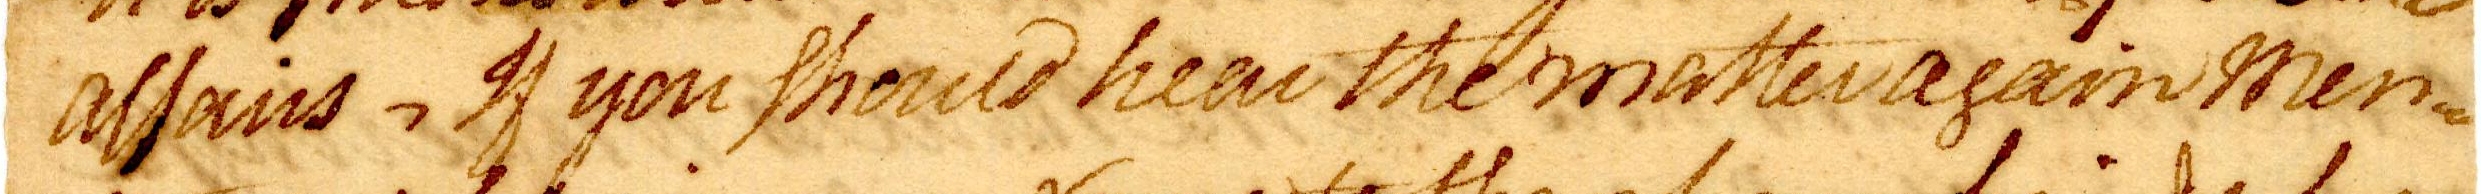affairs. If you should hear the matter again Men-
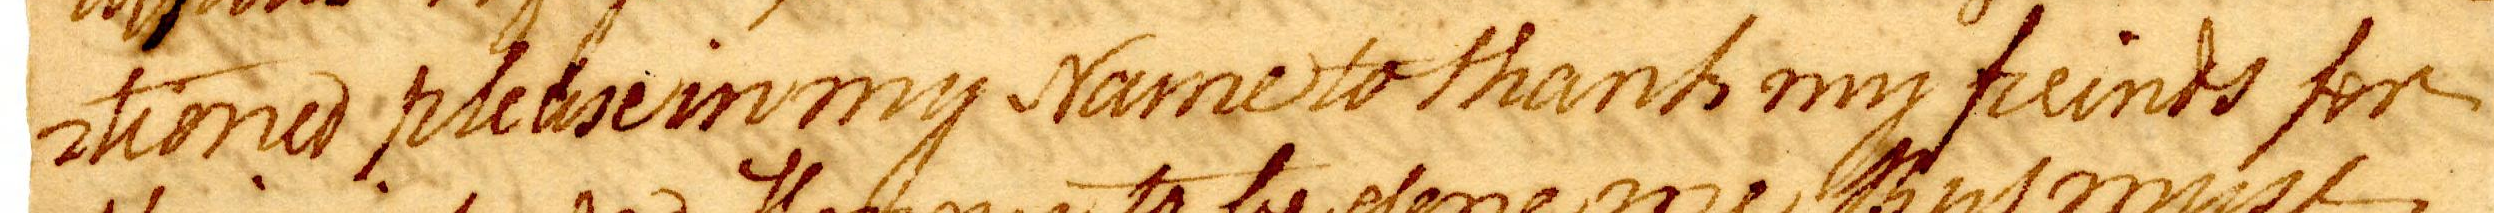-tioned please in my Name to thank my freinds for
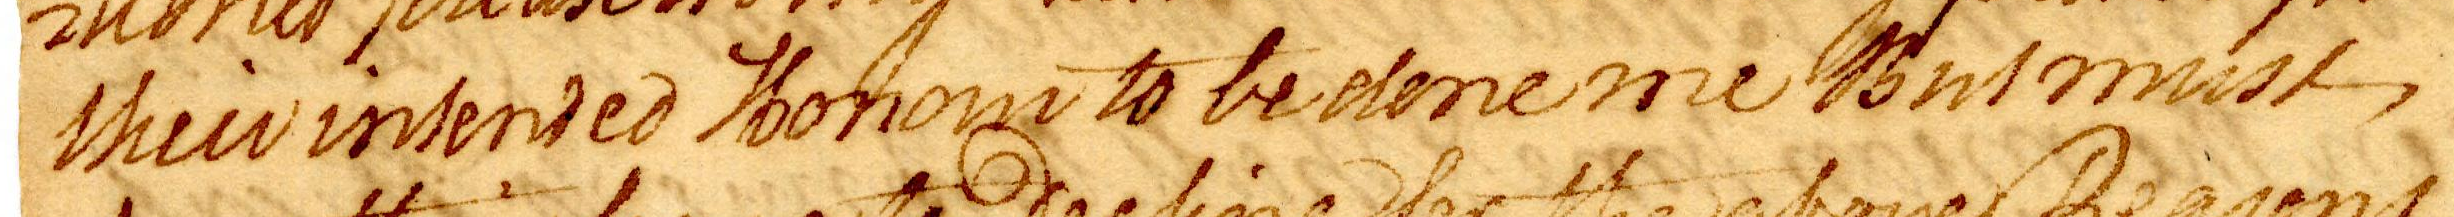their intended Honor to be done me But must
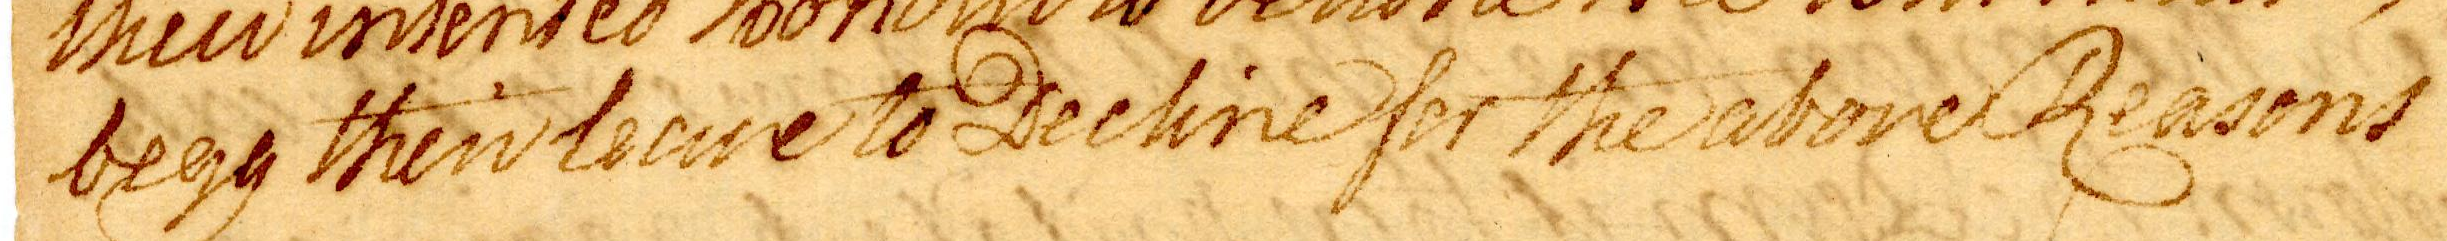begg then leave to Decline for the above Reasons
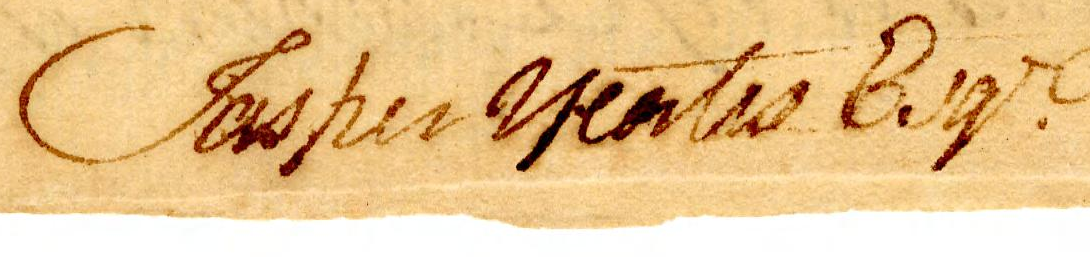Jasper Yeates Esq^r.
